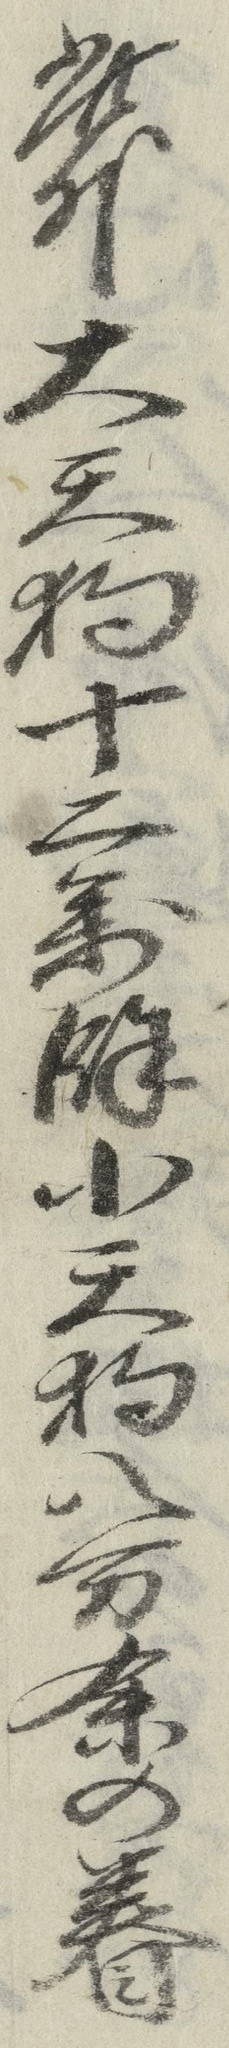此外大天狗十二万餘小天狗八万余の眷
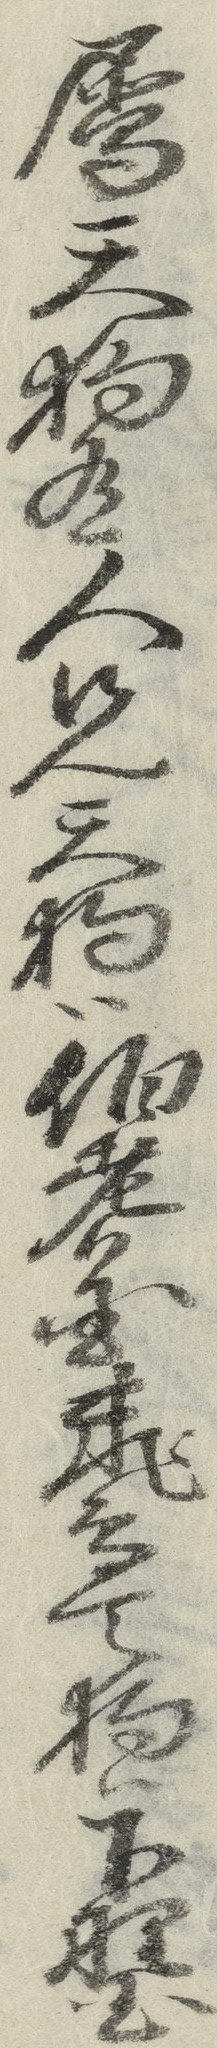属天狗有人見天狗は伯耆国飛鳥天狗は下野国
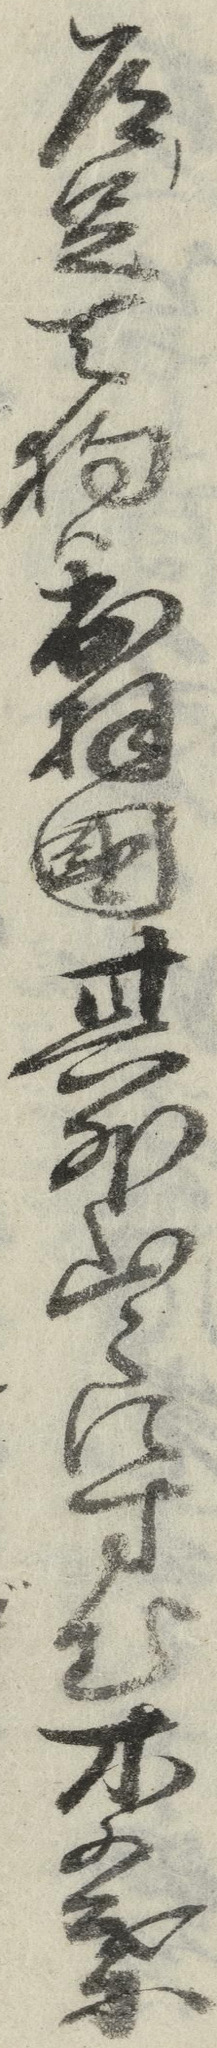道足天狗は出羽国其外山々にすむ木の葉
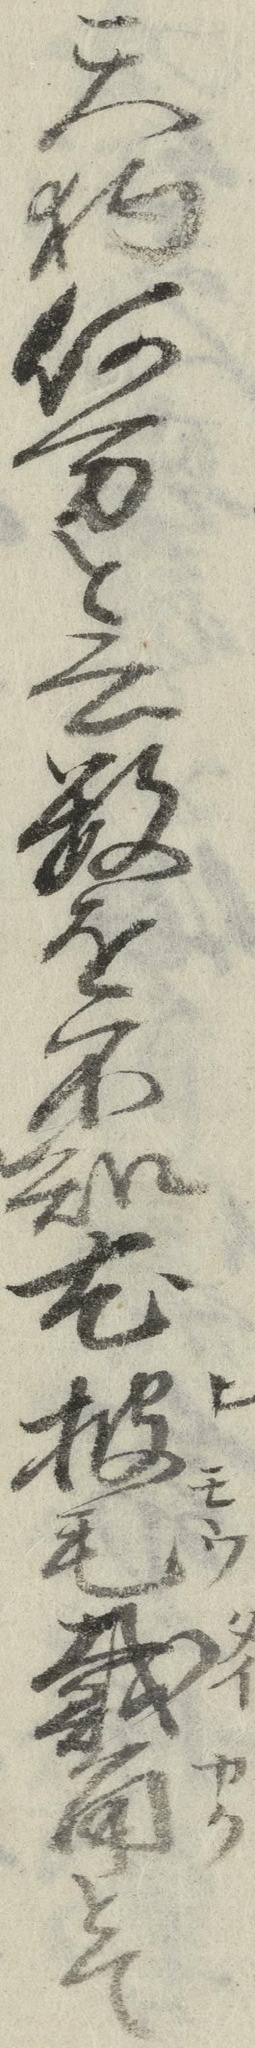天狗何万と云数を不知尤披毛戴角とて
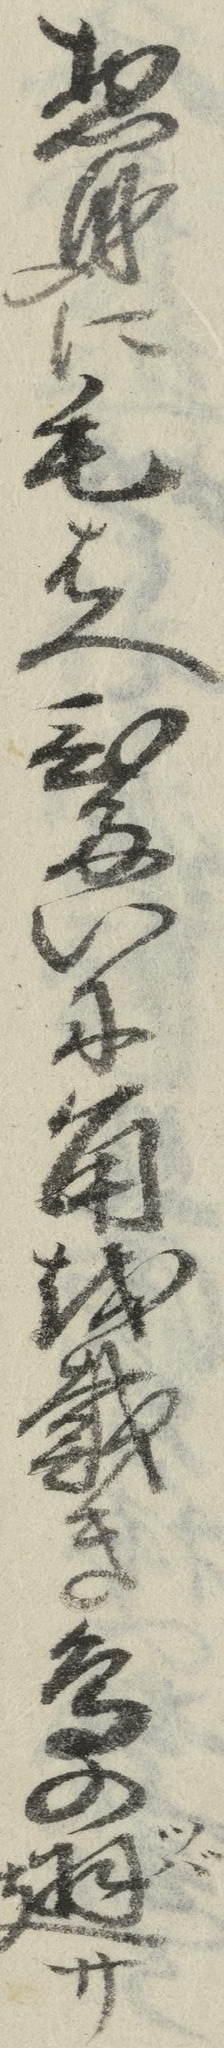惣身に毛はへひたいに角を戴き鳥の翅サ
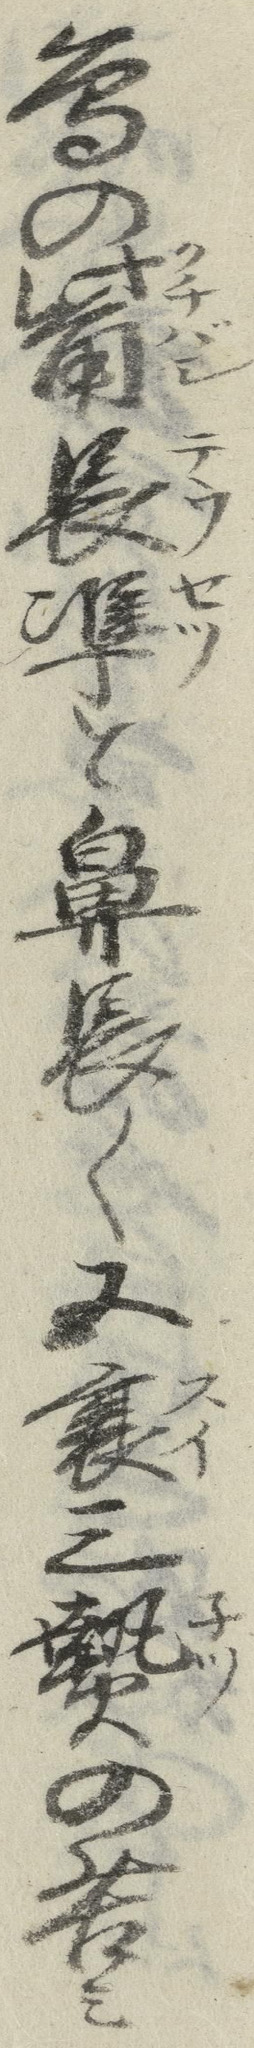鳥の觜長準と鼻長く五衰三熱の苦み
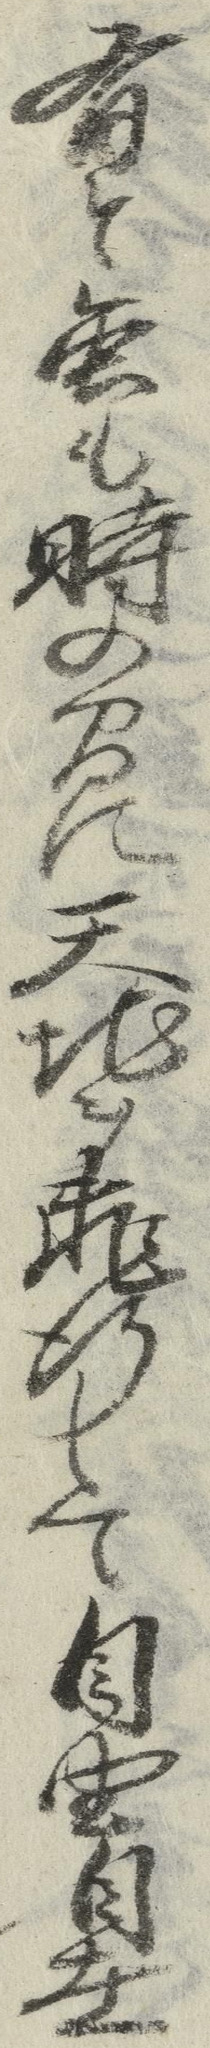有と雖も時の間に天地ヲ飛行して自由自在
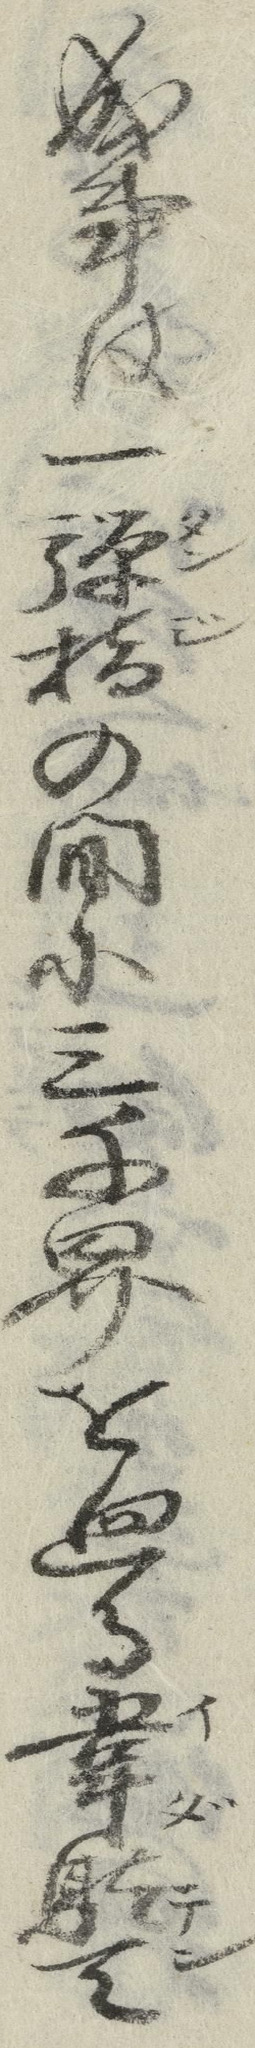成事は一弾持の間に三千界を廻る韋駄天
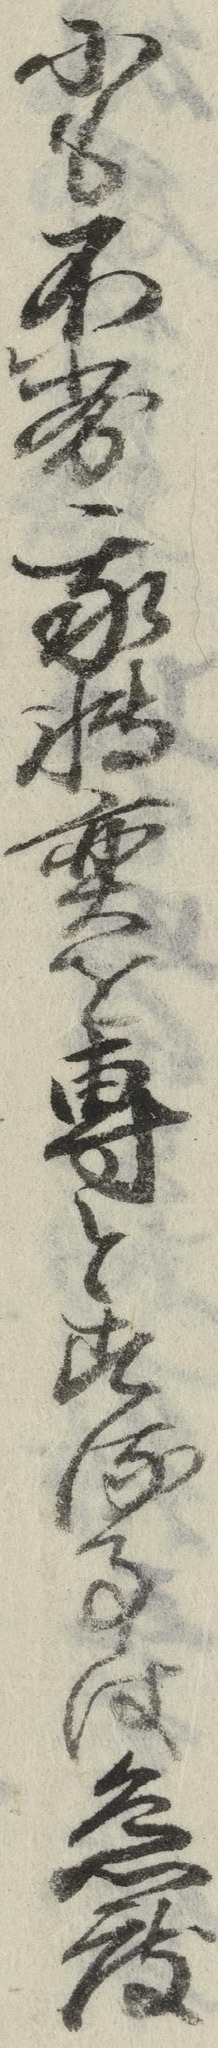にも不劣我博奕を専とする事は急度
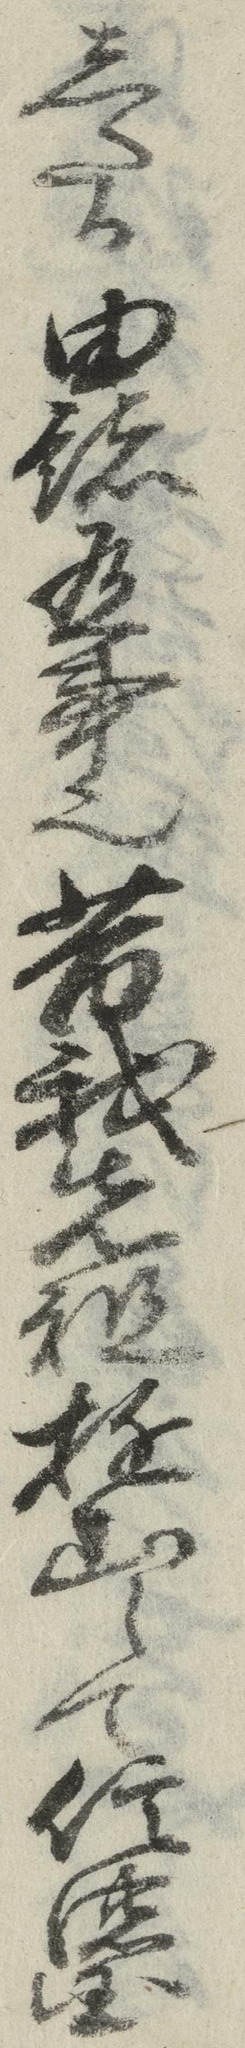したる由諸有事也昔我先祖遊山して信濃国
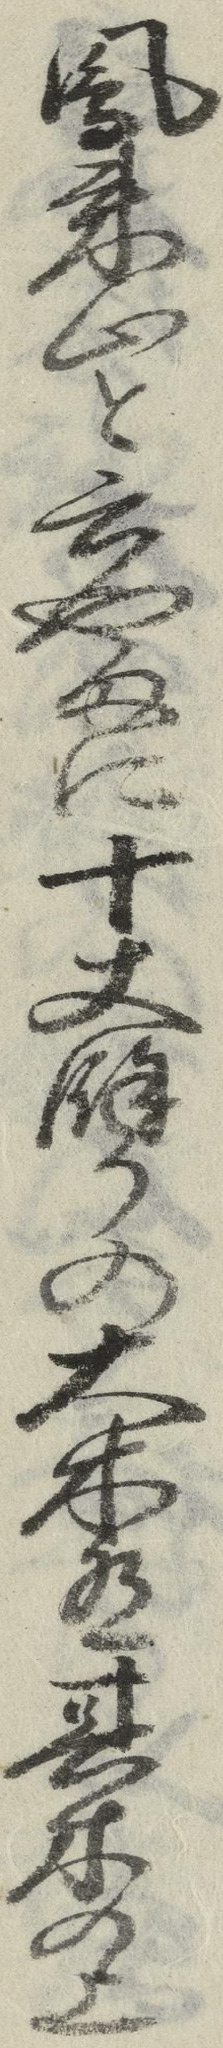鳳来山と云やるに十丈餘りの大木有其木の上
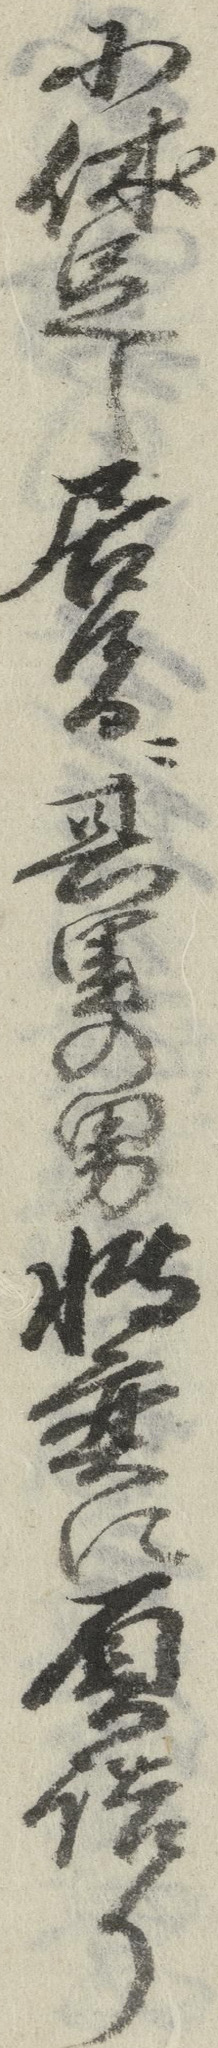に休足し居けるに其里の男博奕に負詰り
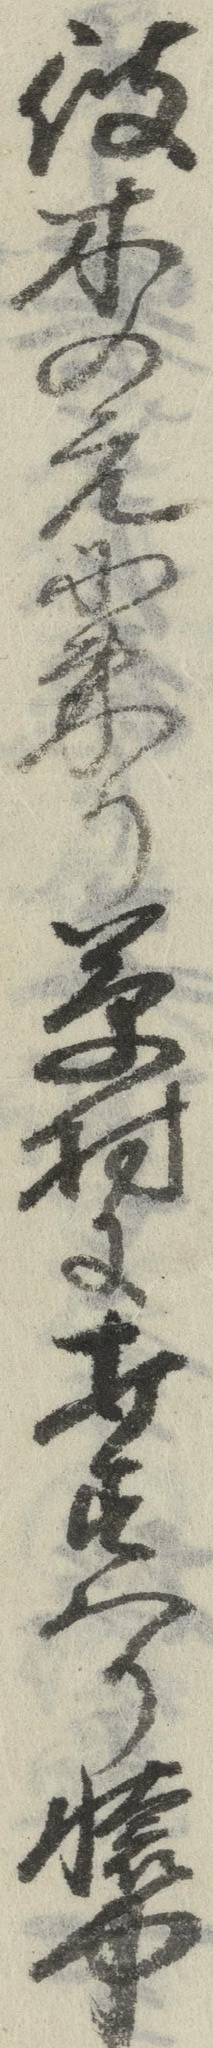彼木の元に来り草村に打すはり懐中

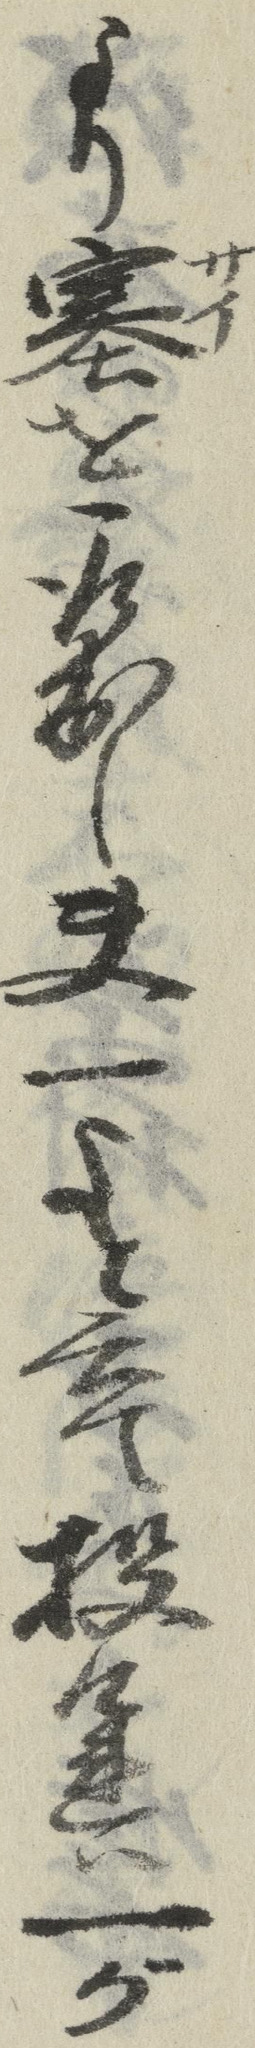より賽を取出し夫一よと云て投けれは一が
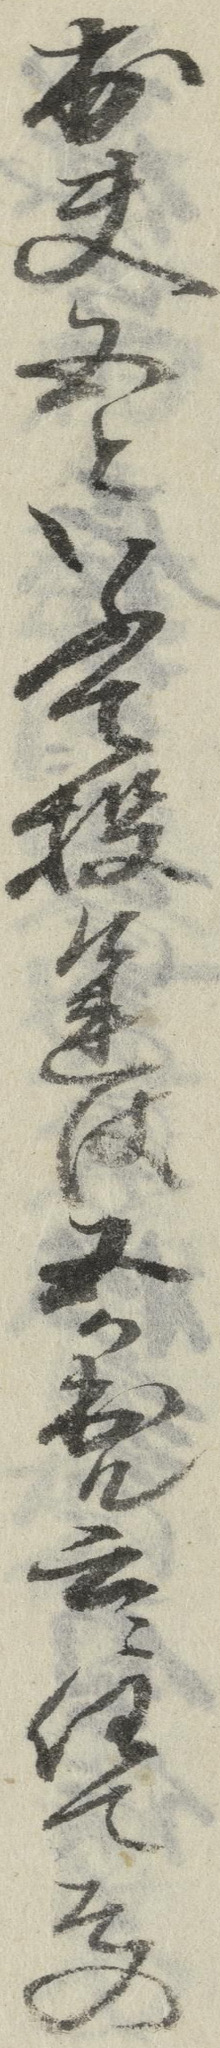出夫五といふて投けれは五か出ル云に任てその
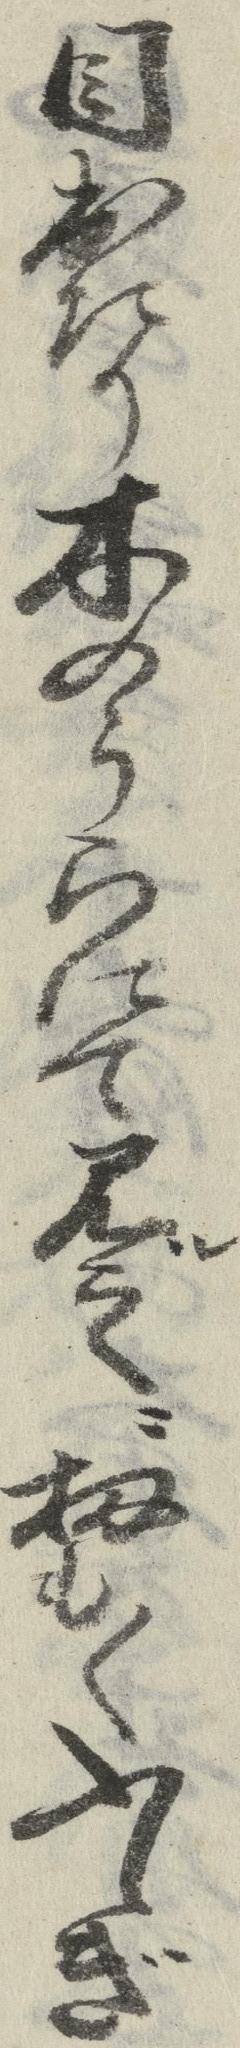目出たり木のうらにて見之に扨も〳〵ふしぎ
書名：浅間大焼騒動記　上
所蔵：東京大学地震研究所図書室 Earthquake Research Institute Library, The University of Tokyo, JAPAN
